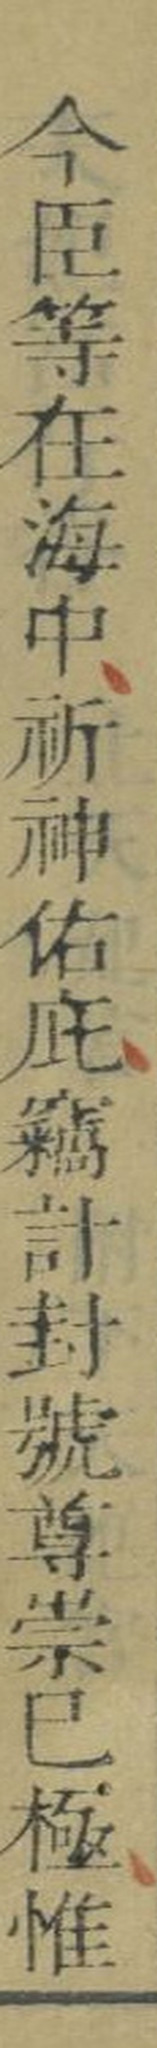今臣等在海中祈神佑庇竊計封號尊崇巳極惟
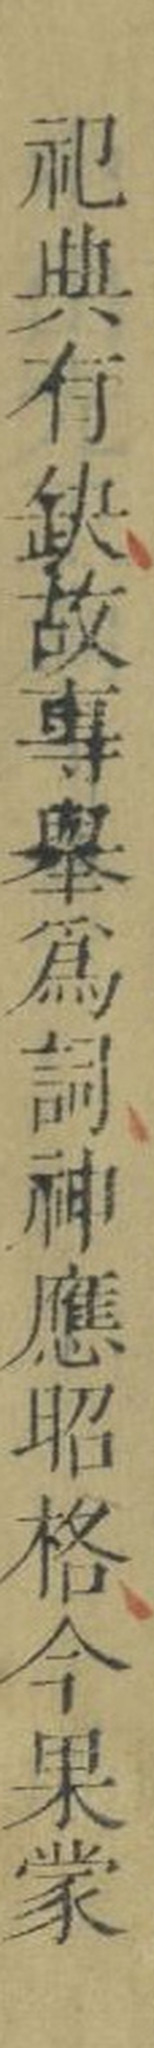祀典有缺故專舉爲詞神應昭格今果蒙
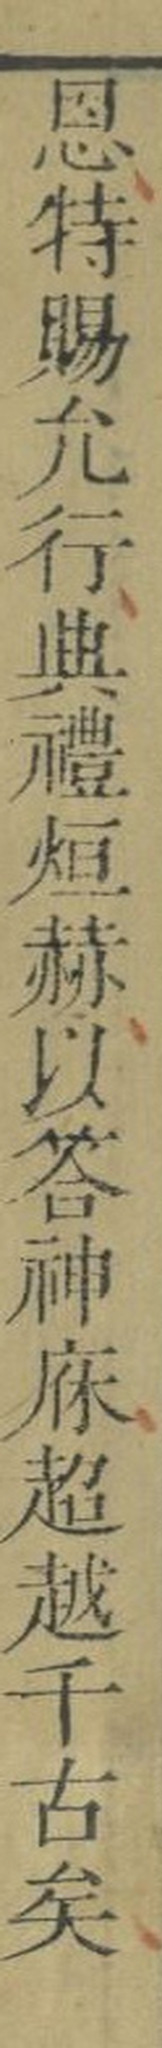恩特賜允行典禮烜赫以答神庥超越千古矣

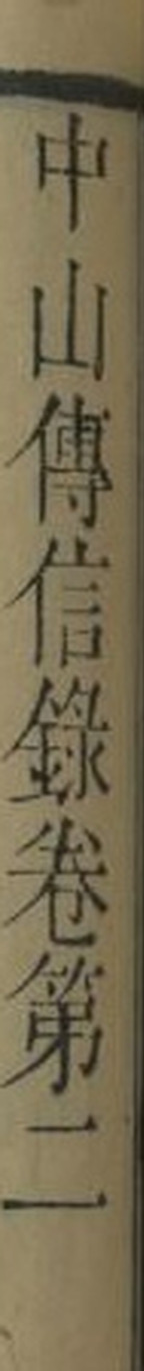中山傳信錄卷第二
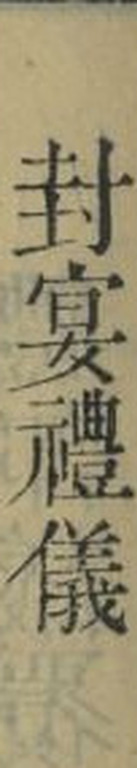封宴禮儀
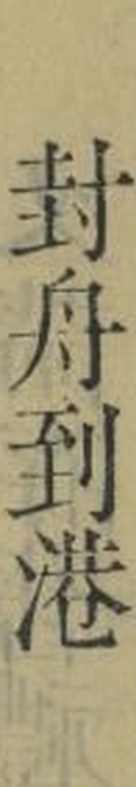封舟到港
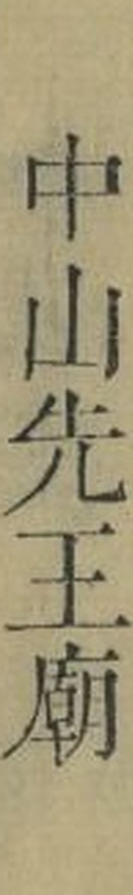中山先王廟
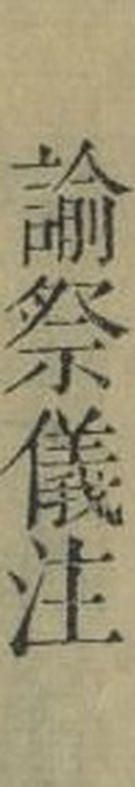諭祭儀注
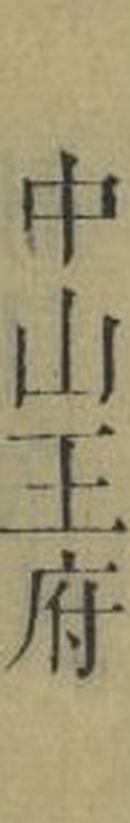中山王府

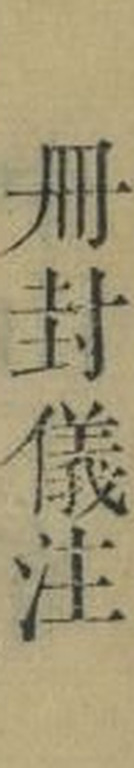冊封儀注
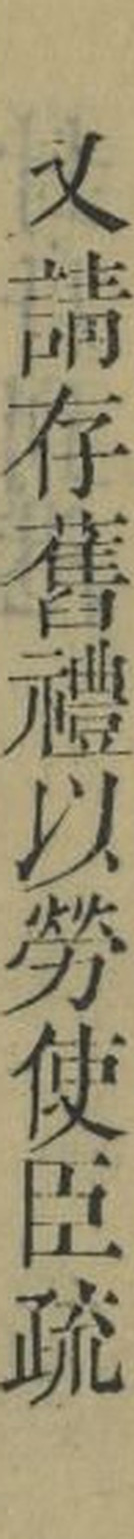又請存舊禮以勞使臣疏

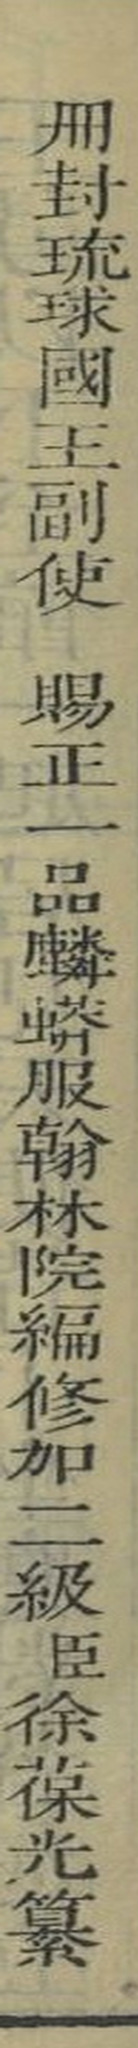冊封琉球國王副使賜正一品麟蟒服翰林院編修加二級臣徐葆光纂
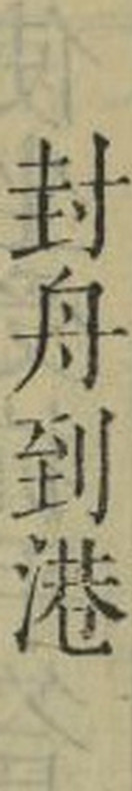封舟到港
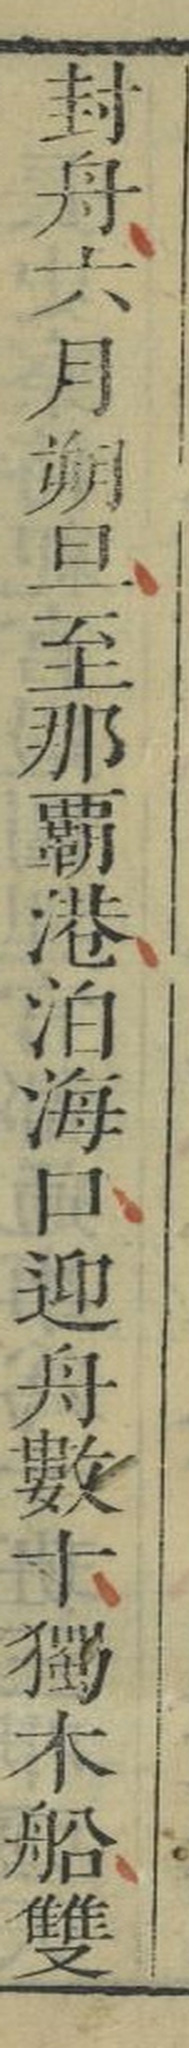封舟六月朔旦至那覇港泊海口迎舟數十獨木船雙
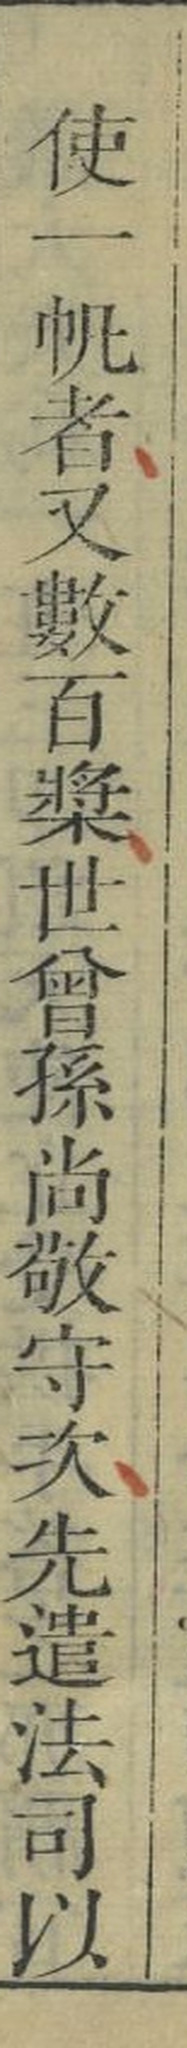使一帆者又數百槳世曾孫尚敬守次先遣法司以
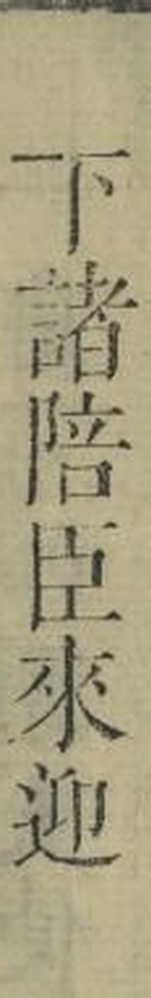下諸陪臣來迎
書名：中山伝信録 巻一、巻二
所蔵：University of the Ryukyus Library
